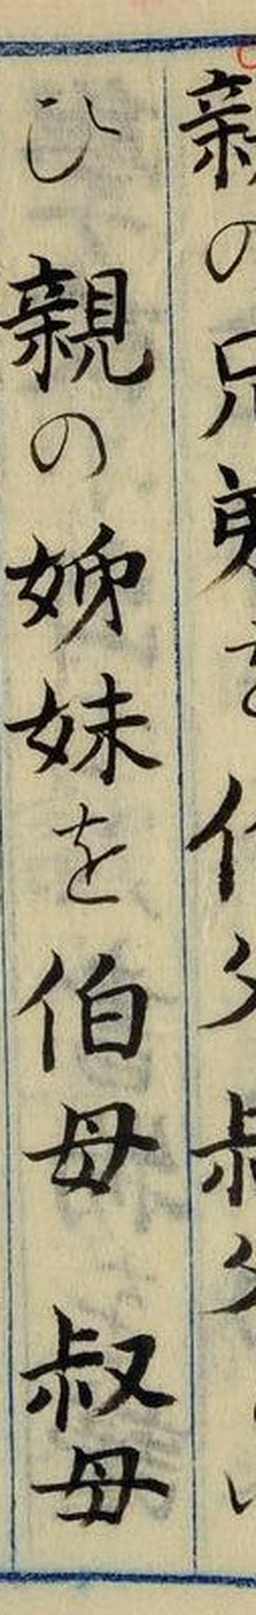ひ親の姉妹を伯母叔母
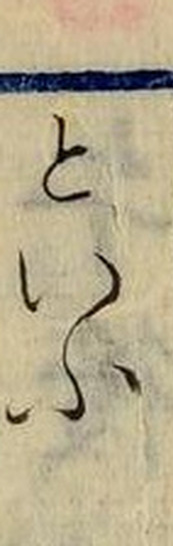といふ
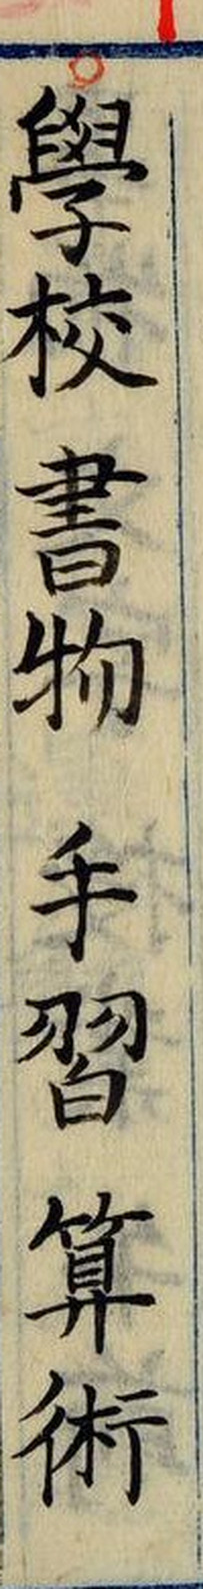〇学校書物手習算術

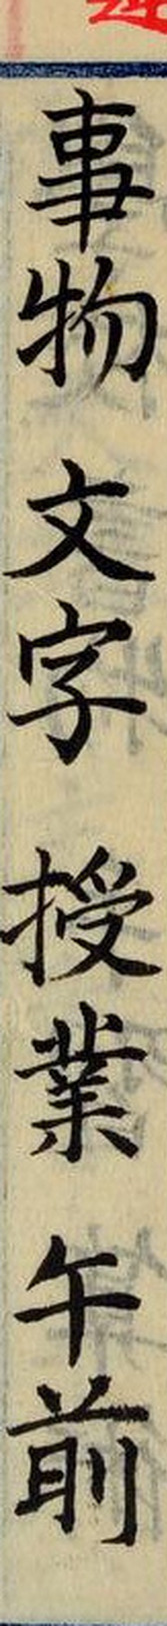事物文字授業午前
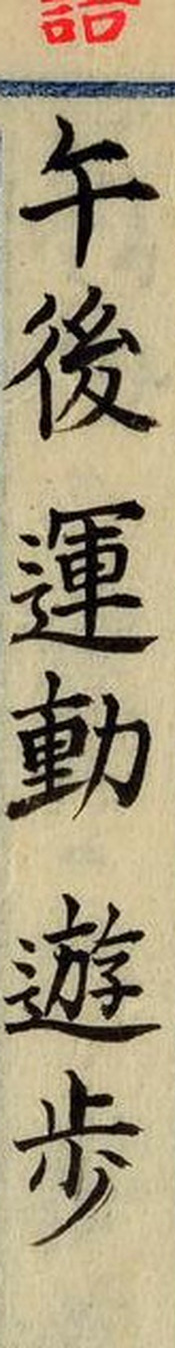午後運動遊歩
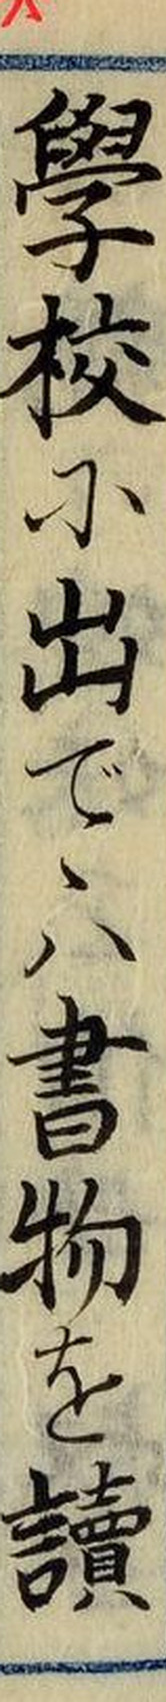学校に出でてハ書物を読
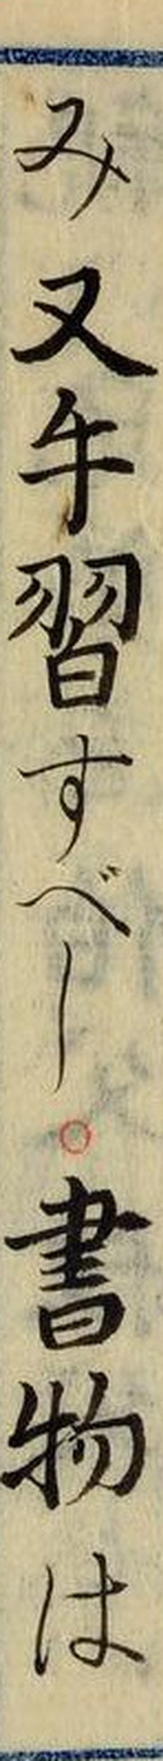み又手習すべし〇書物は
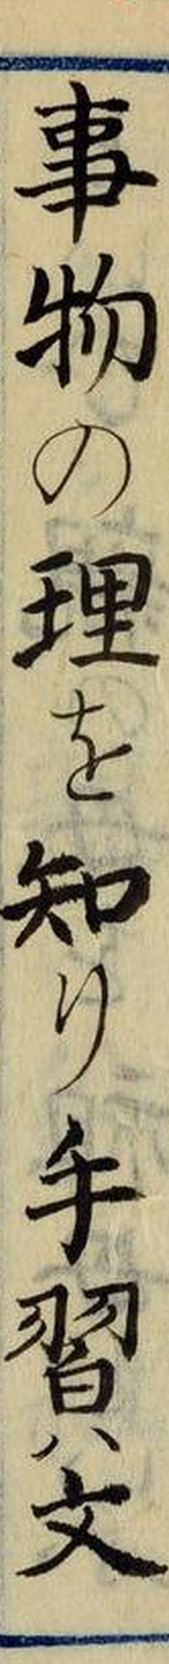事物の理を知り手習ハ文
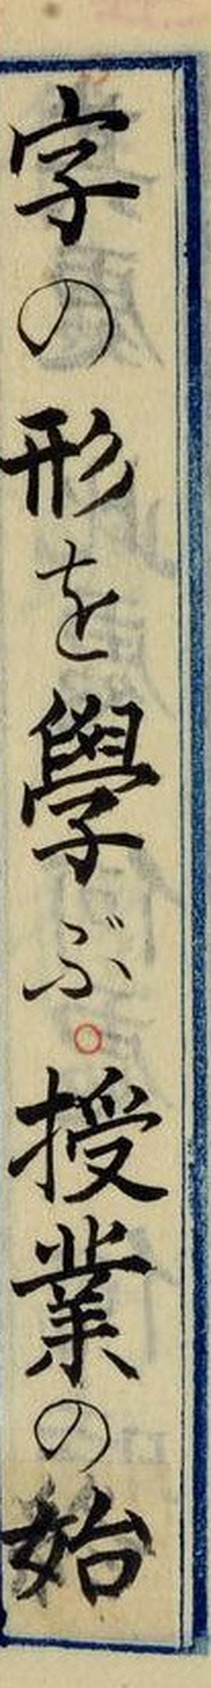字の形を学ぶ〇授業の始
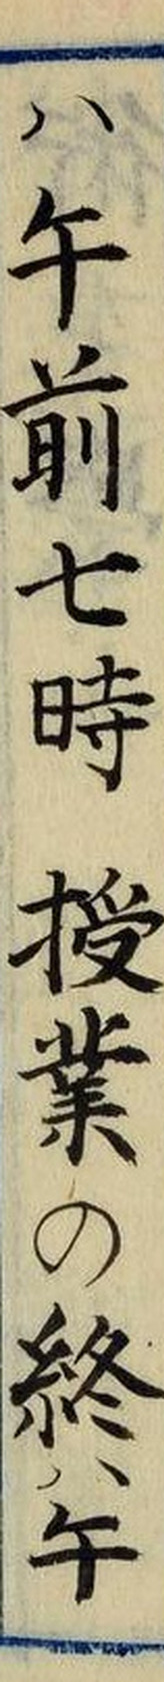ハ午前七時授業の終、午
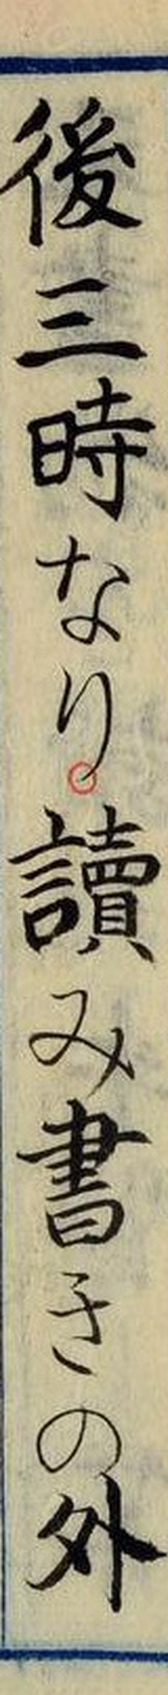後三時なり〇読み書きの外
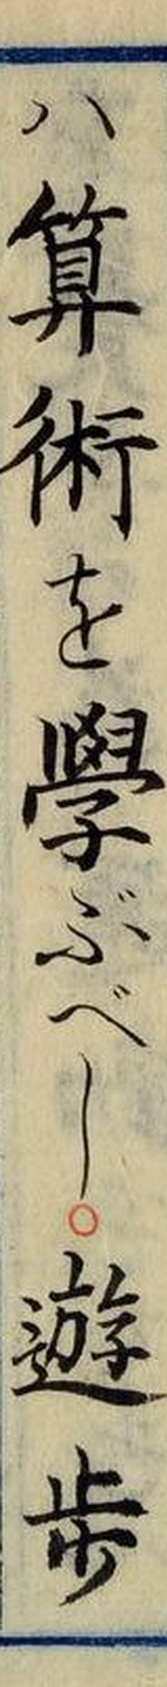ハ算術を学ぶべし〇遊歩
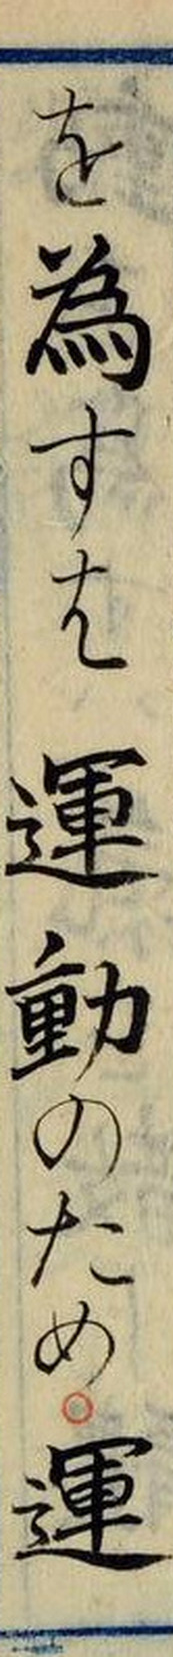を為すは運動のため〇運

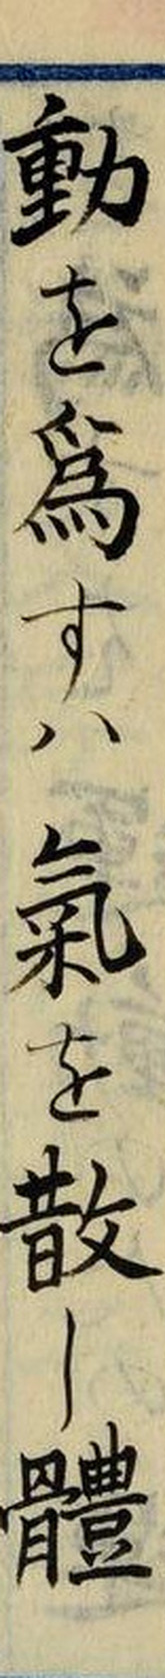動を為すハ気を散し体
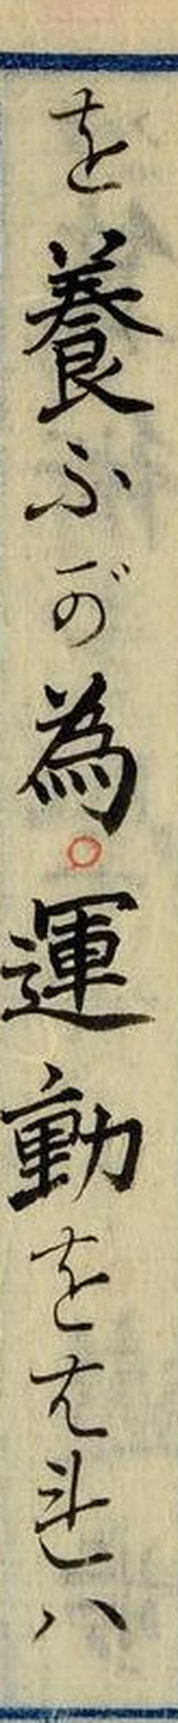を養ふが為〇運動をはれハ
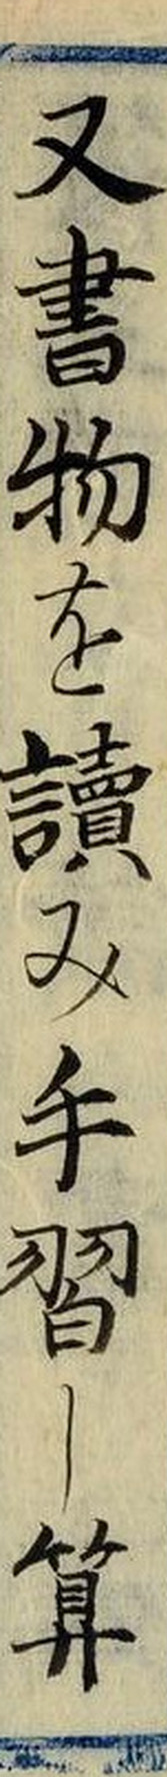又書物を読み手習し算
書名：村名・連語
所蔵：福井県文書館 Fukui Prefectural Archives
